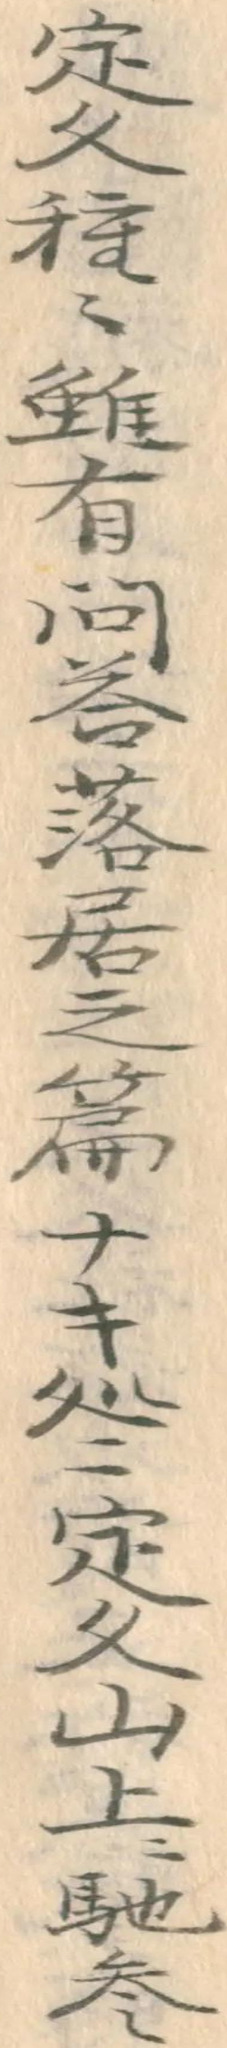定久種々雖有問答落居之篇ナキ処ニ定久山上ニ馳参
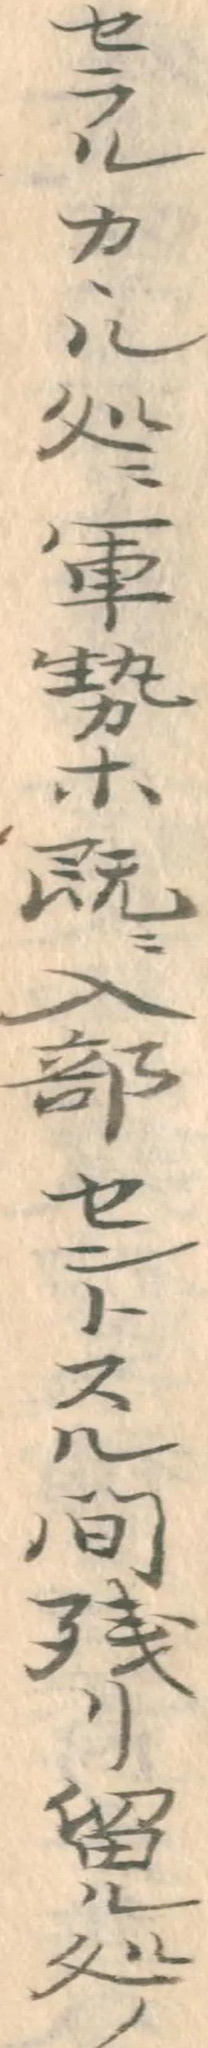セラルカヽル処ニ軍勢等既ニ入部セントスル間残リ留ル処ノ
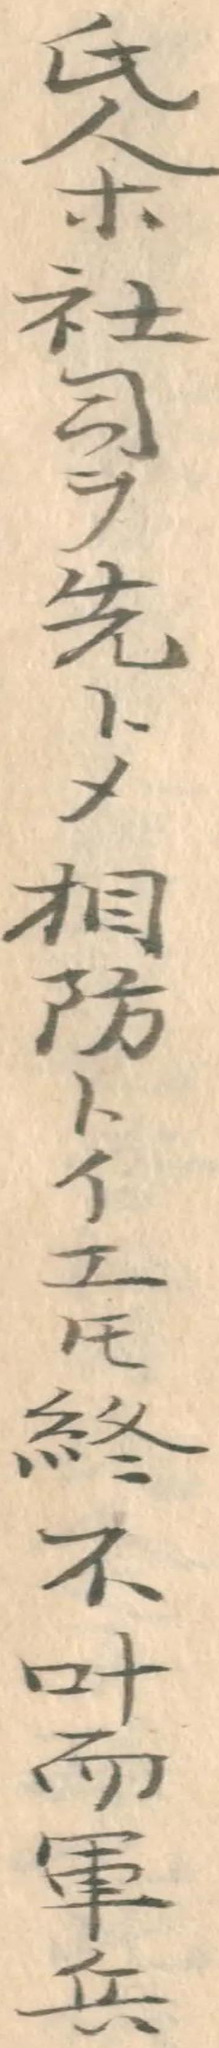氏人等社司ヲ先トメ相防トイエトモ終不叶而軍兵
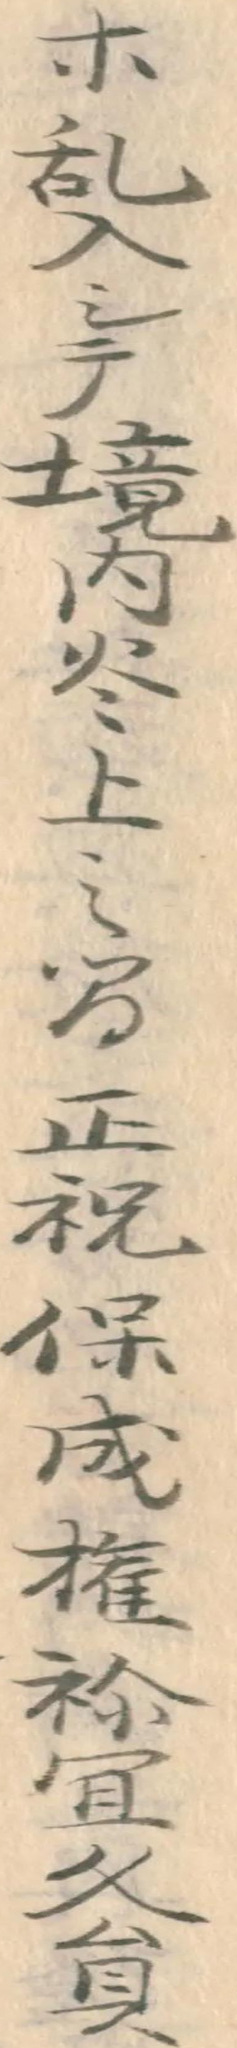等乱入シテ境内炎上之間正祝保成権祢宜久員
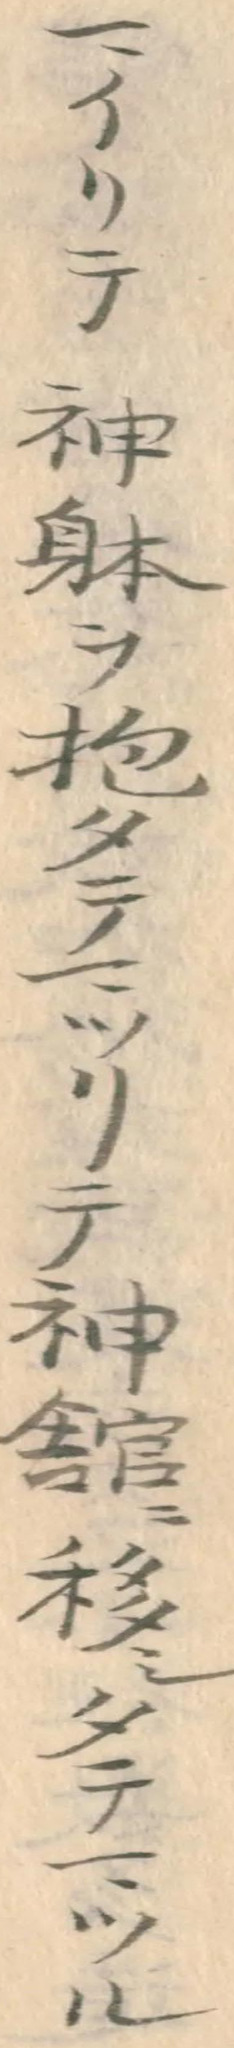マイリテ神体ヲ抱タテマツリテ神館ニ移シタテマツル
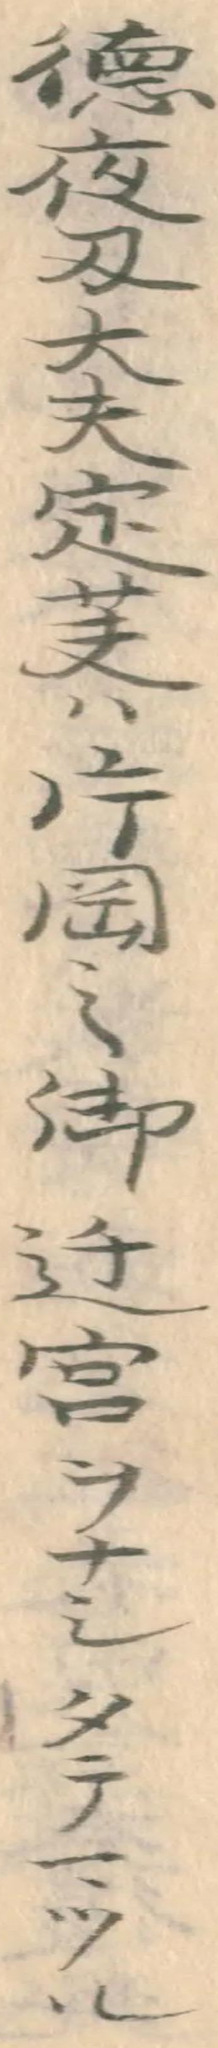徳夜刃大夫定芙ハ片岡之御遷宮ヲナシタテマツル
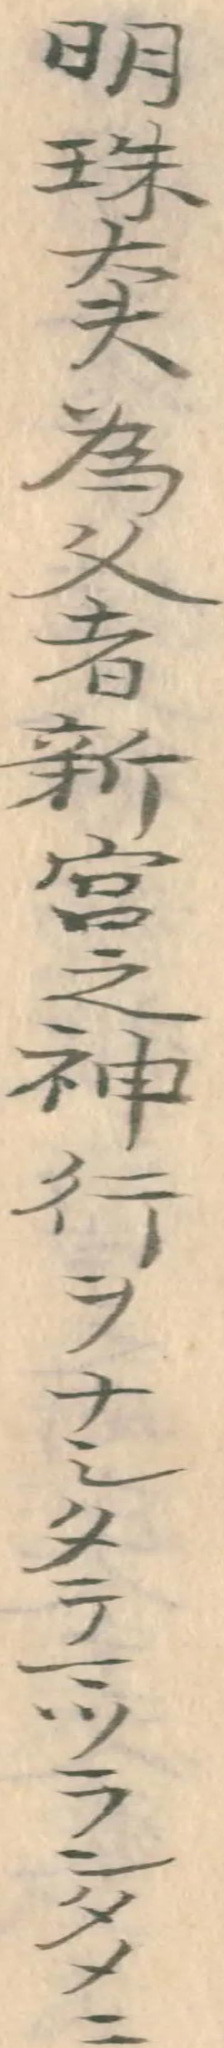明珠大夫為久者新宮之神行ヲナシタテマツランタメニ
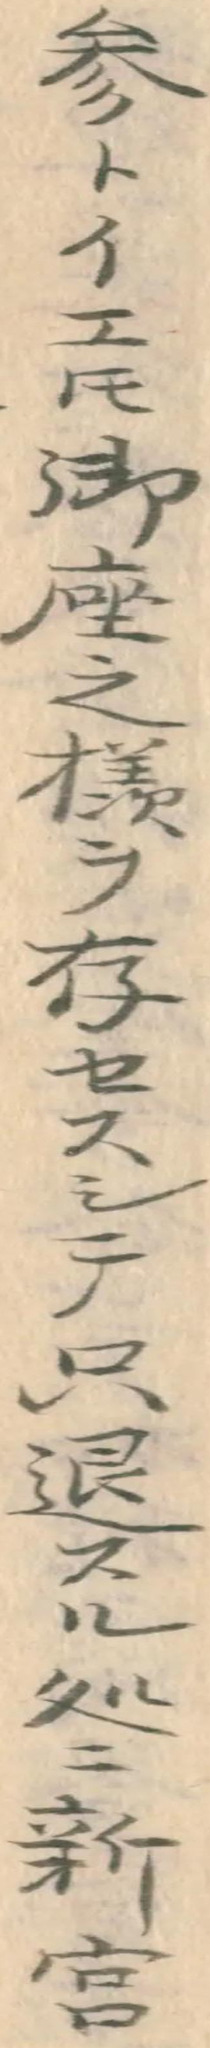参トイエトモ御座之様ヲ存セスシテ只退スル処ニ新宮
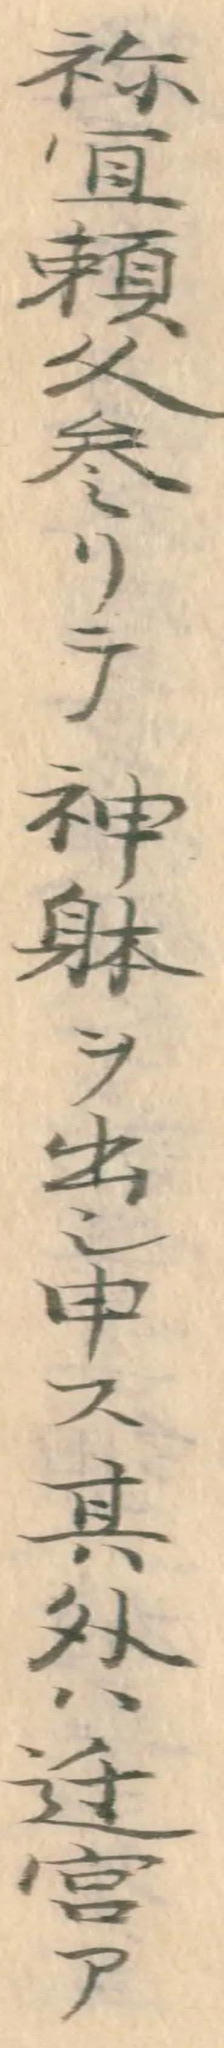祢宜頼久参リテ神体ヲ出シ申ス其外ハ遷宮ア
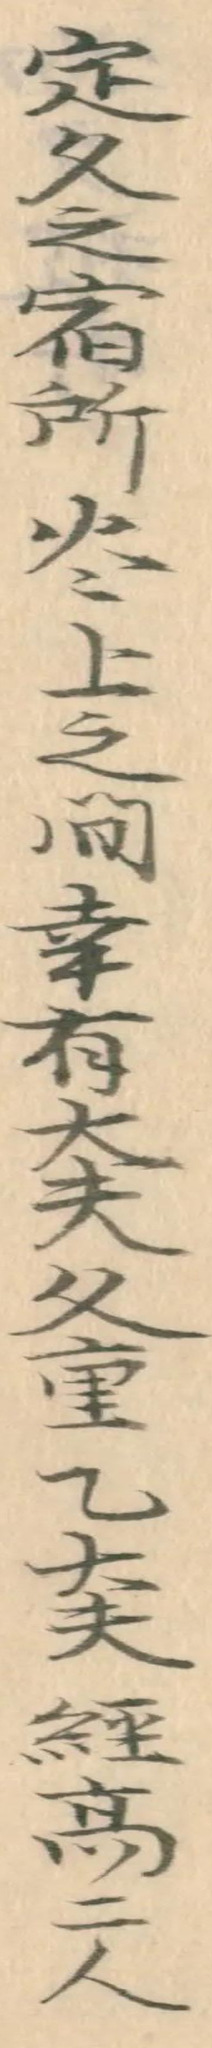定久之宿所炎上之間幸有大夫久重乙大夫経高二人
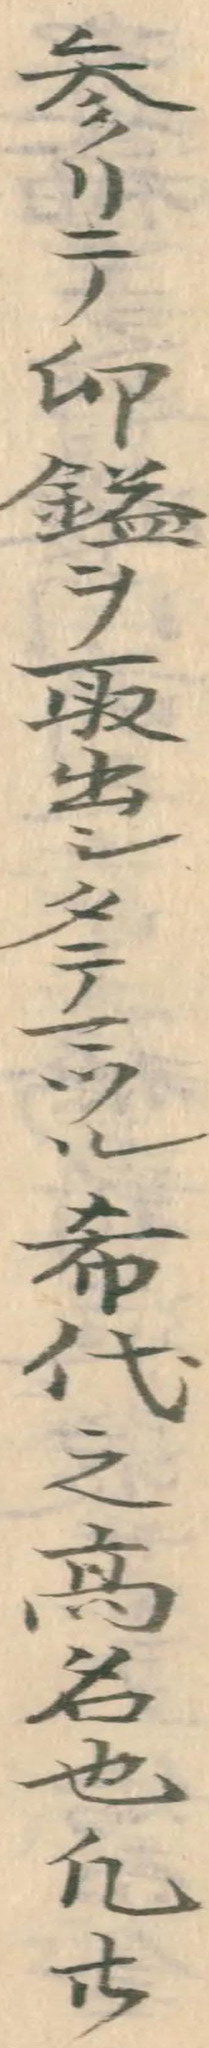参リテ印鎰ヲ取出シタテマツル希代之高名也凡廿
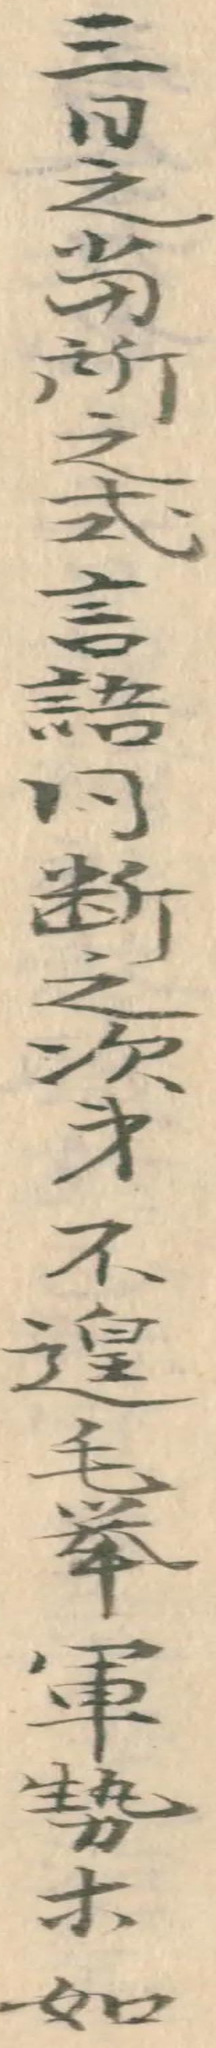三日之当所之式言語同断之次第不遑毛挙軍勢等如
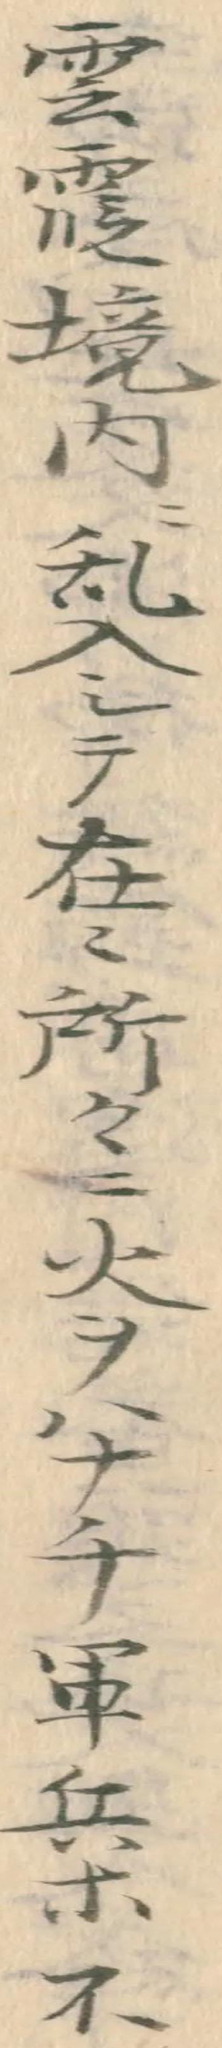雲霞境内ニ乱入シテ在々所々ニ火ヲハナチ軍兵等不
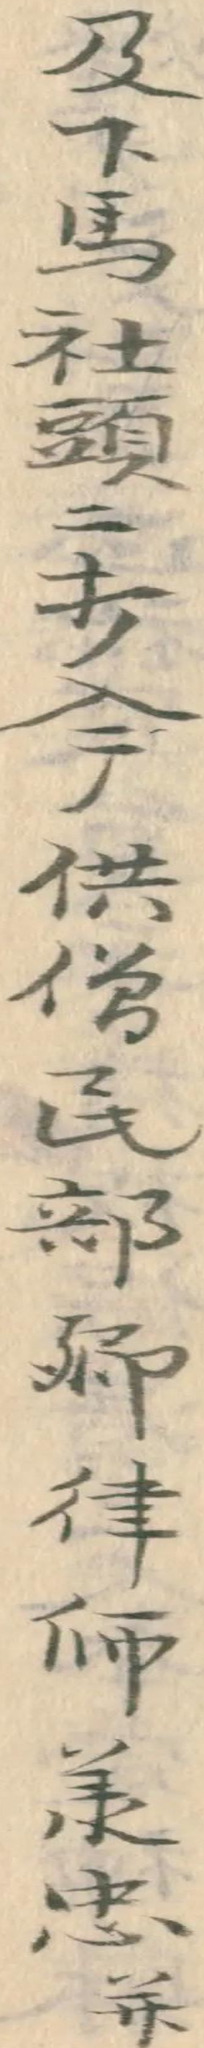及下馬社頭ニ打入テ供僧民部卿律師承忠并
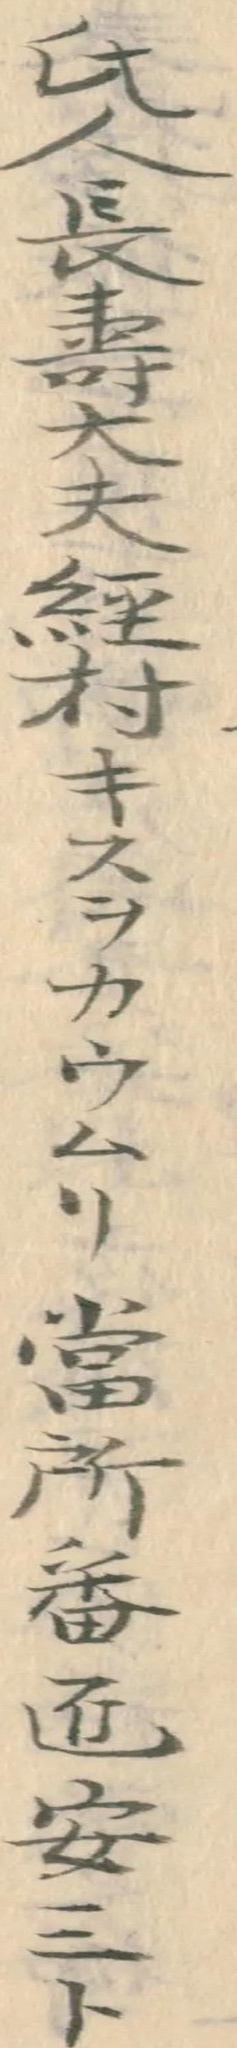氏人長寿大夫経村キスヲカウムリ当所番匠安三ト
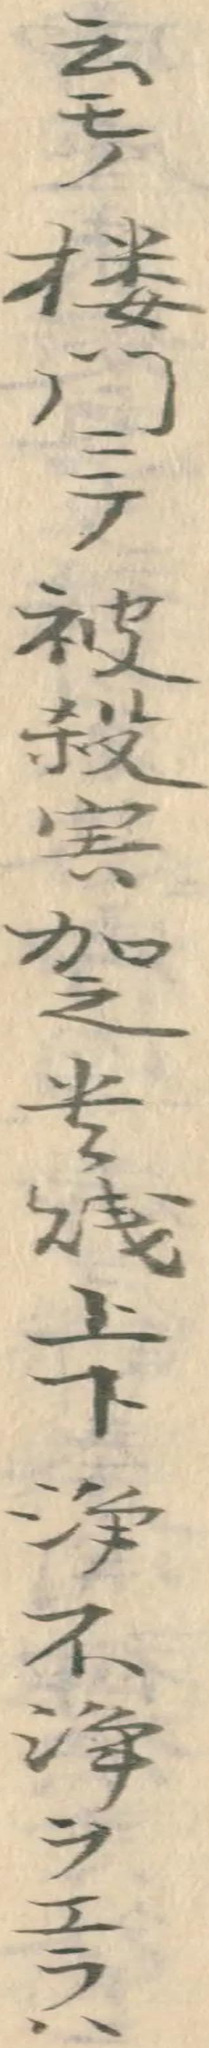云モノ楼門ニテ被殺害加之貴賤上下浄不浄ヲエラハ
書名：賀茂社記録. 第24冊
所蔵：国立国会図書館 National Diet Library, JAPAN
